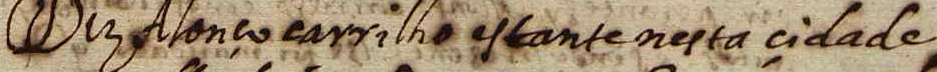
Diz Alonço carrilho estante nesta cidade
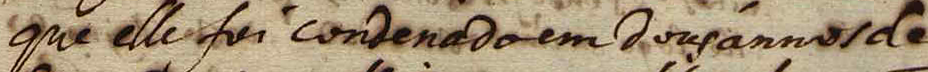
que elle foi condenado em dous annos de
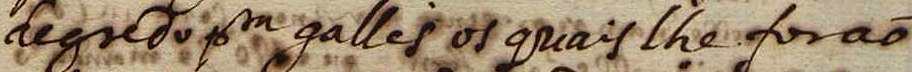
segredo pra galles os quais lhe foraõ
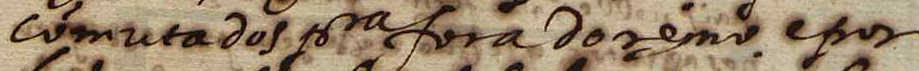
cōmutados pra fora do rejno, e por
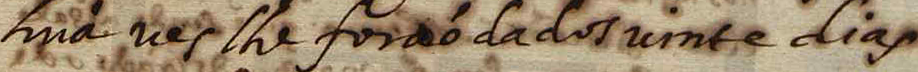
huā ues lhe forão dados uinte dias
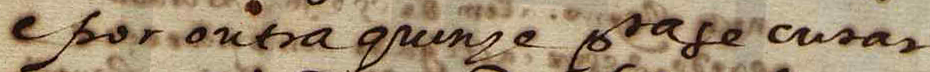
e por outra quinze pra se curar
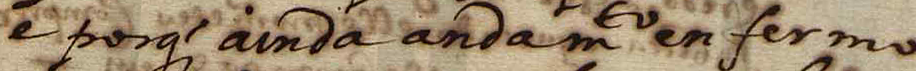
e porq̄ ainda anda mto enfermo
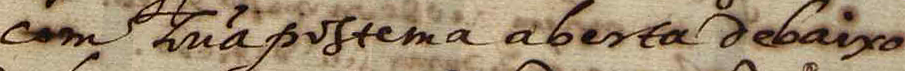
com huā postema aberta debaixo
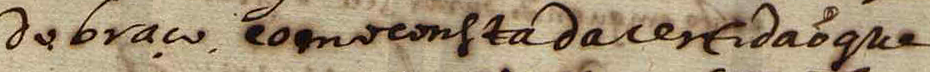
do braço, como consta da certidaõ que
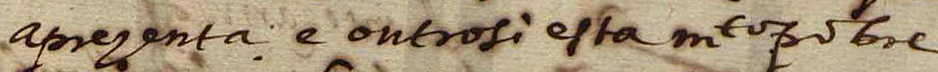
aprezenta, e outrosi esta mto pobre
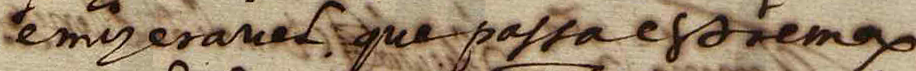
e mizerauel, que passa estremas
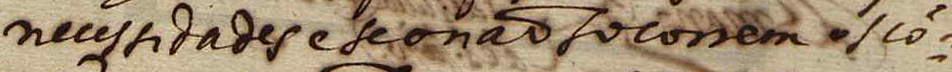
necessidades e se o naõ socorrem os cō
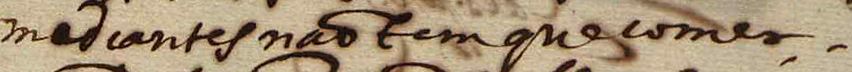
mediantes naõ tem que comer
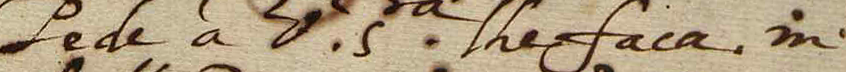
Pede a V. Sra. lhe faça m̄
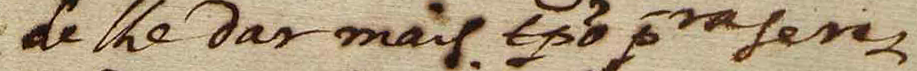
de lhe dar mais tpō pra se re
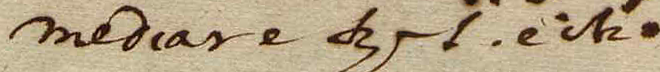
mediar e R. I. e .M.
